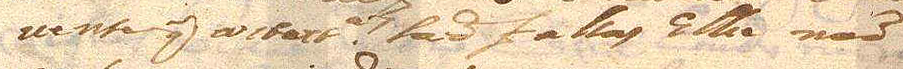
uense q̄ as test.as saõ falsas E lhe naõ
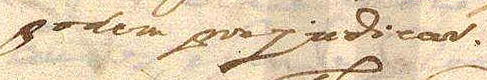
podem prejudicar.
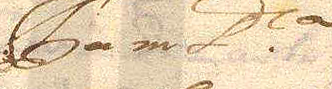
Tam P.ca
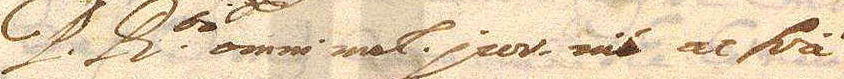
P. R.to omni mel. jur. mō ac frā
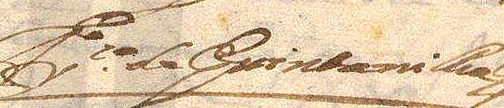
Frc.o da Quintanilha
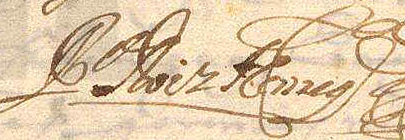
P.o Roiz Henriq̄
